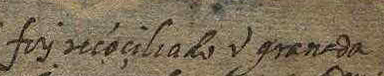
foy recōciliado ē granada
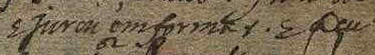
E Jurou em forma ./ E acu
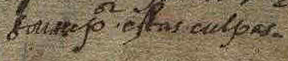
sousse por estas culpas
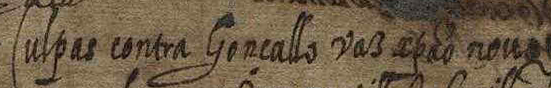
Culpas contra Gonçallo vaz xpaõ nouo
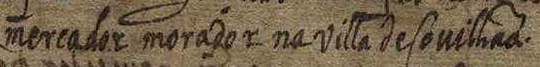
mercador morador na villa de Couilhāa.
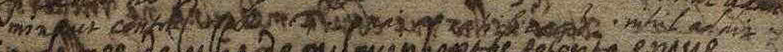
min ut contra illas n̄ uai a ratificação nihil adit.
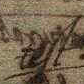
testa
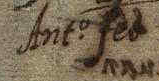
Anto. feo
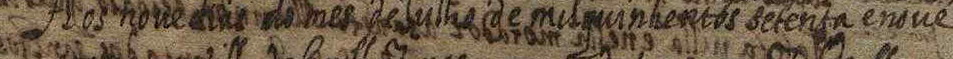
Aos noue dias do mes de Iulho de mil quinhentos setenta e noue
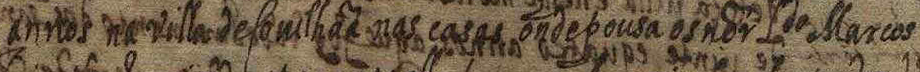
annos na villa de Couilhaā nas casas onde pousa o snōr L.do Marcos
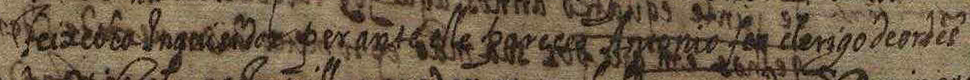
Teixeira Inquisidor perante elle pareceo Antonio feo clerigo de ordes̄
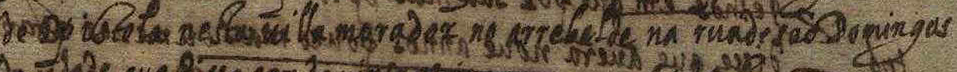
de Epistola nesta uilla morador no arrebalde na rua de saõo Domingos
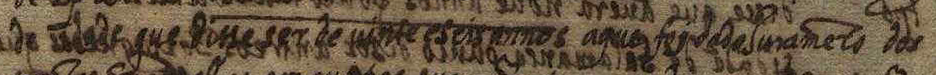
de idade que disse ser de uinte e seis annos a que foy dado Juramēto dos
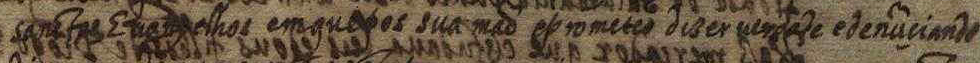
sanctos Euagelhos em que pos sua mão e prometeo dizer uerdade e denūciando
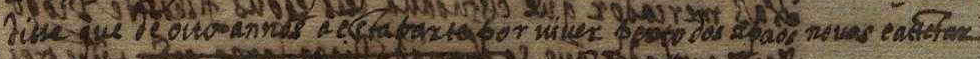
disse que de oito annos a esta parte por uiuer perto dos xpaõs nouos e attētar
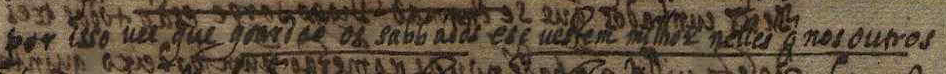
por isso uee que goardaõ os sabbados e se uestem milhor nelles q̄ nos outros
